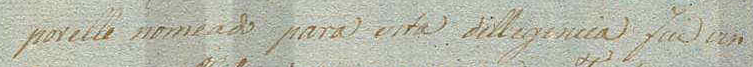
por elle nomeado para esta dillegencia fui vin
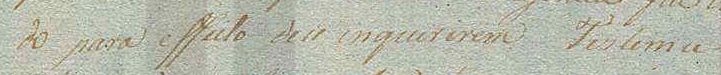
do para effeito de se inquerirem Testemu
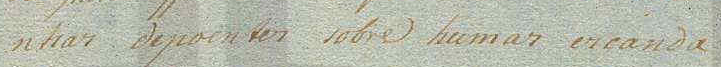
nhas depoentes sobre humas escanda
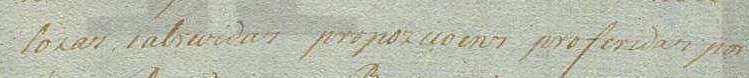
lozaz e atrevidas propoziçoens proferidas por
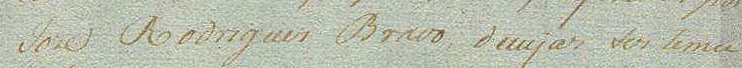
Ioze Rodrigues Bravo de cujaz teztemu
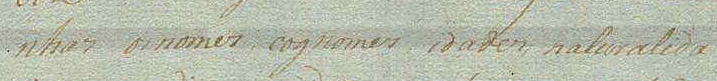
nhaz os nomes, cognomes, idadez, naturalida
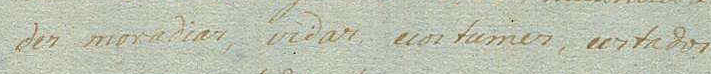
dez moradiaz, vidaz e costumez, e estados
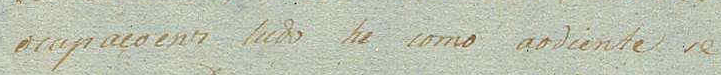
ocupaçoens tudo he como aodiente se
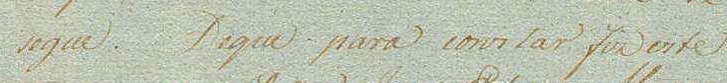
segue. De que para constar fiz este
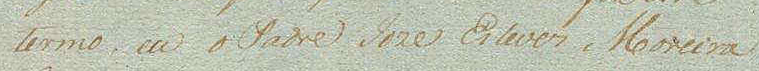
termo, eu o Padre Ioze Esteves Moreira
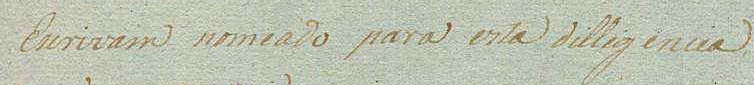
Escrivam nomeado para esta dilligencia
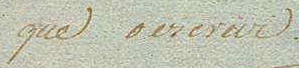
que o escrevi.
